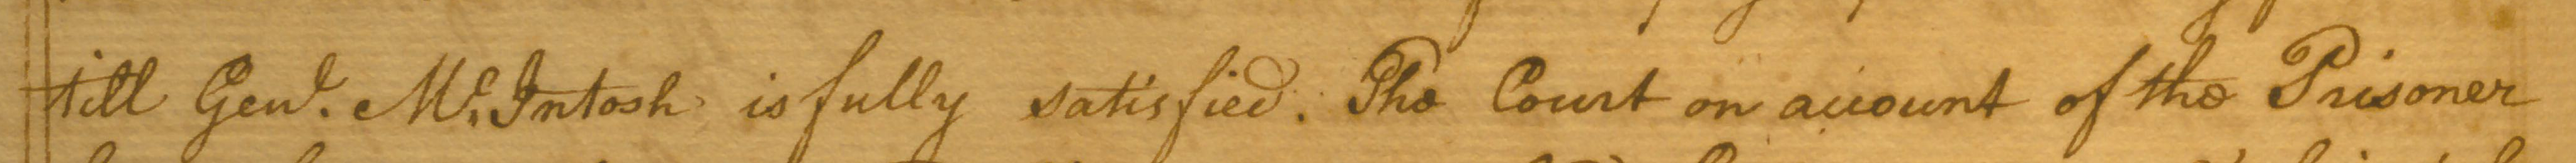till Gen^l. M^c.Intosh is fully satisfied. The Court on account of the Prisoner
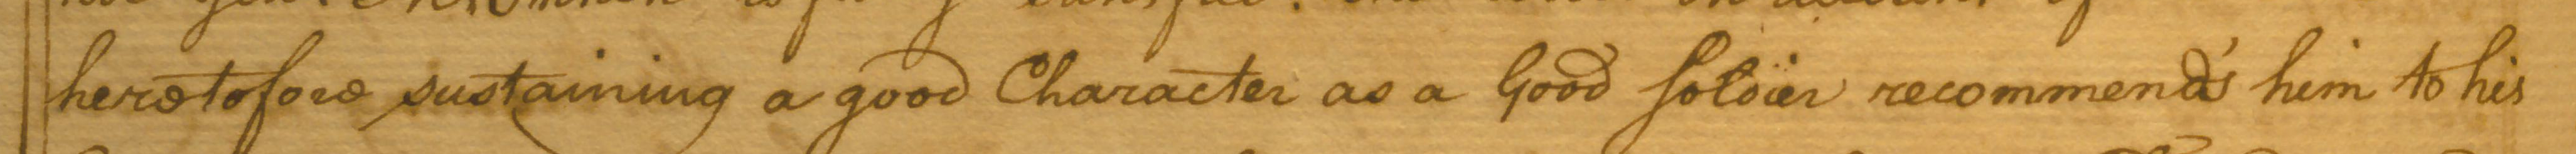heretofore sustaining a good Character as a Good Soldier recommend's him to his
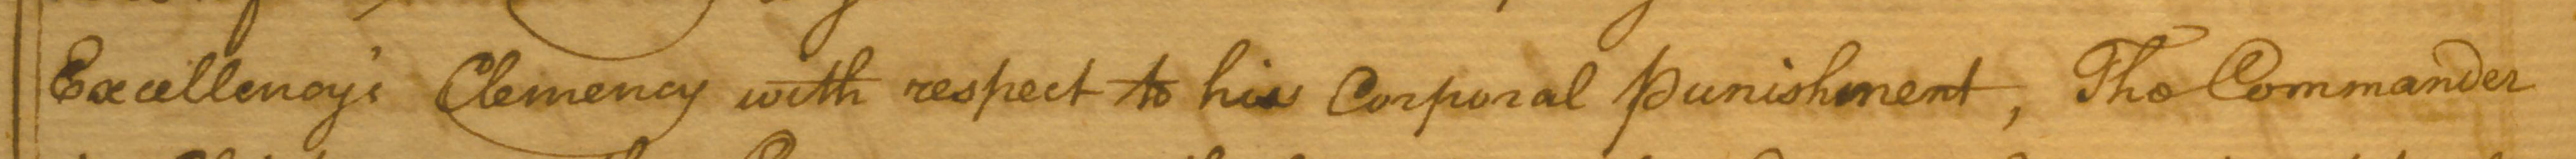Excellency's Clemency with respect to his Corporal punishment, The Commander
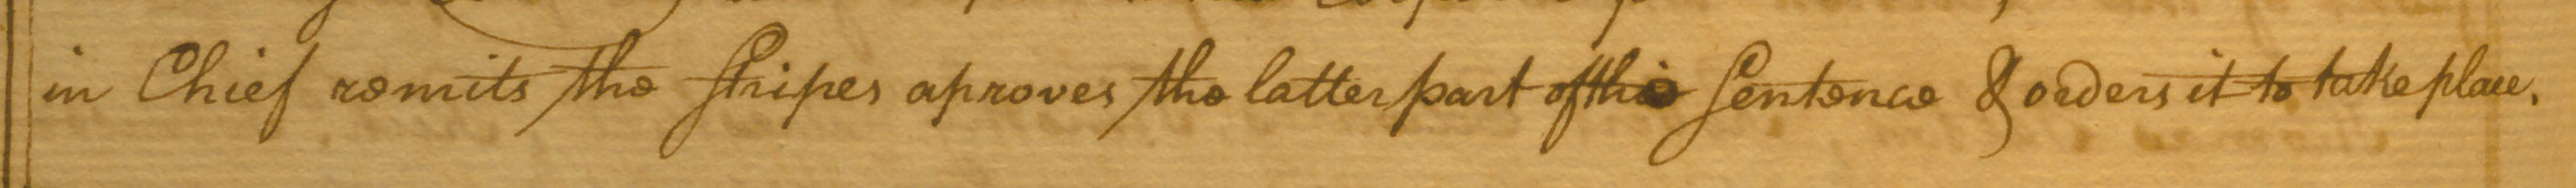in Chief remits the stripes aproves the latter part of this sentence & orders it to take place.
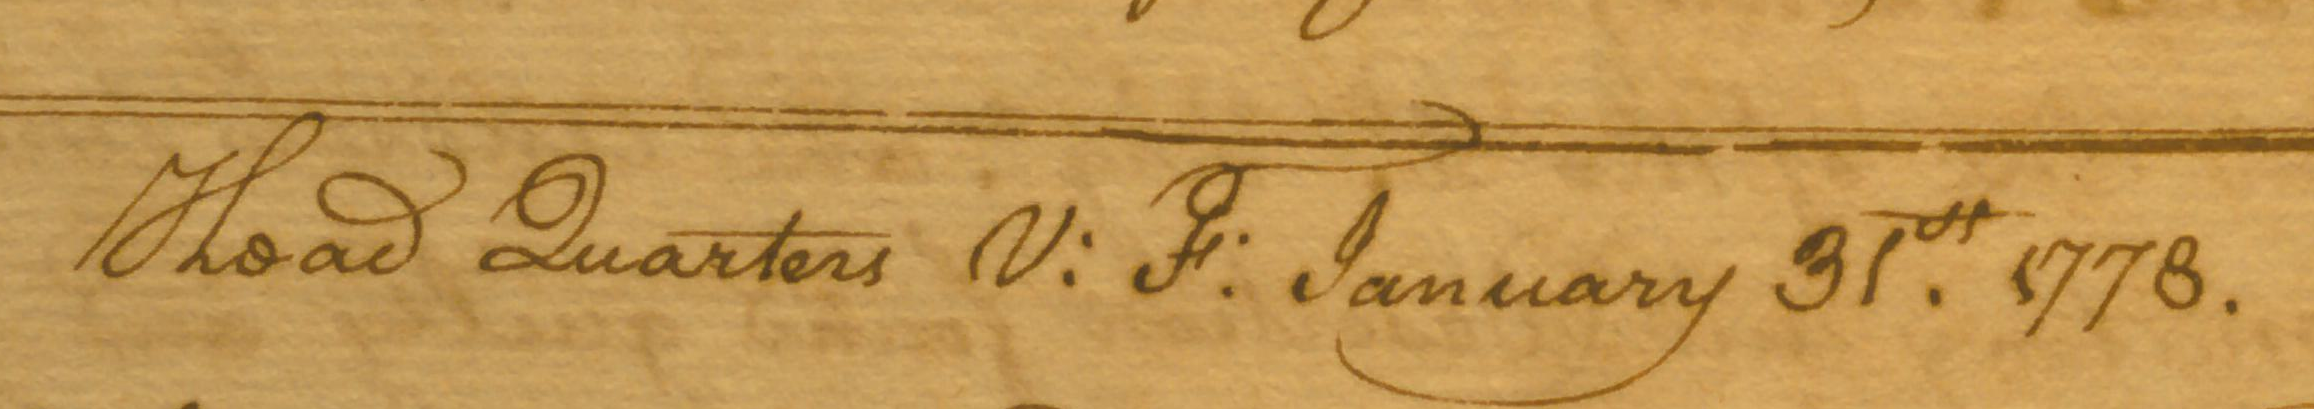Head Quarters V: F: January 31^st. 1778.
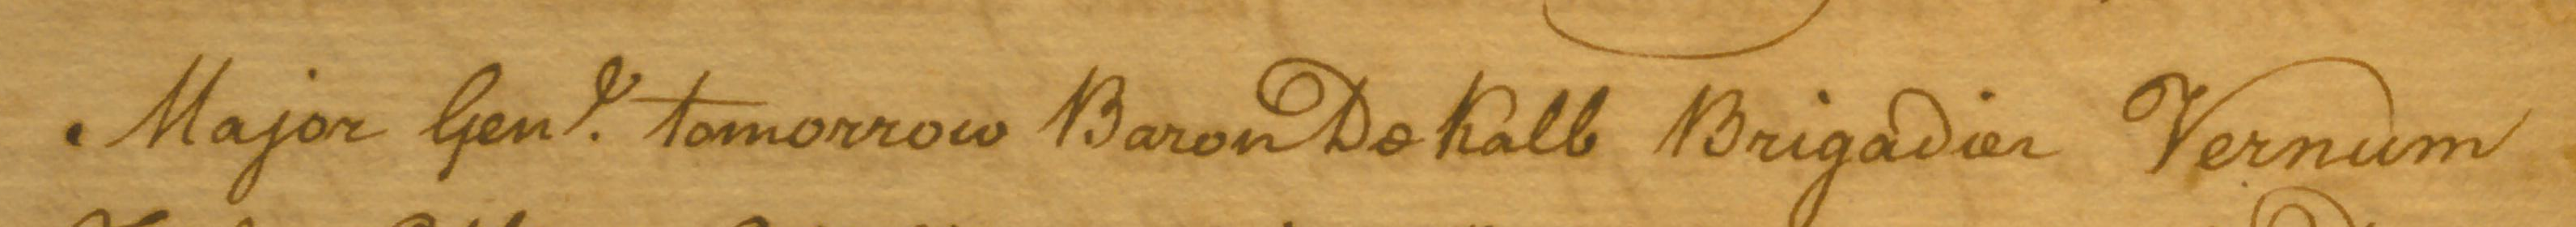Major Gen^l. toorrow Baron De Kalb Brigadier Vernum
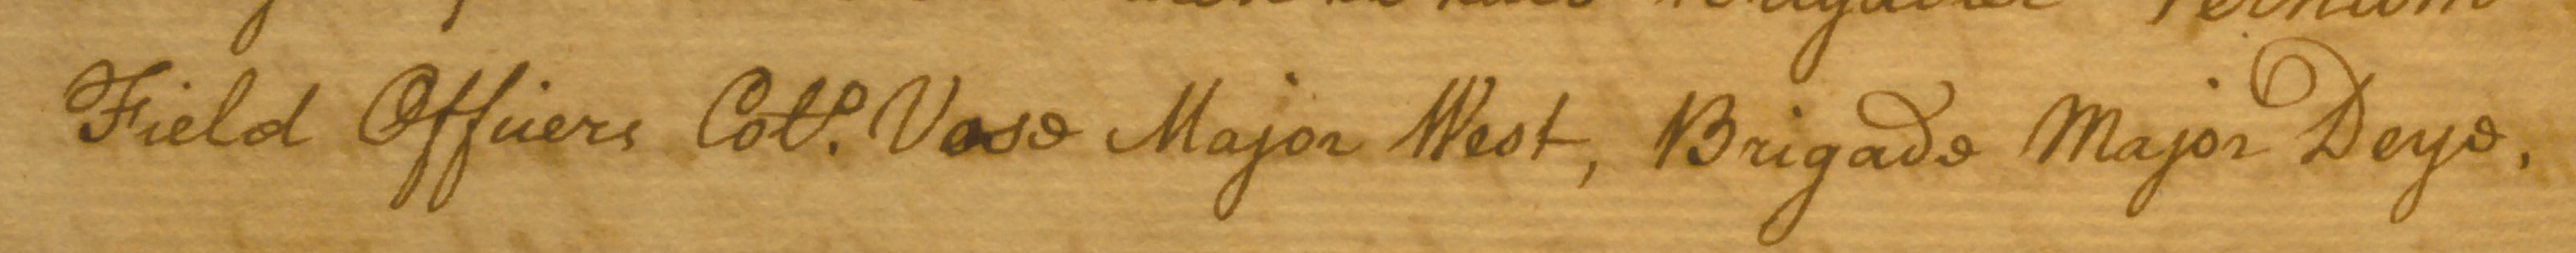Field Officers Col^o. Vose Major West, Brigade Major Deye.
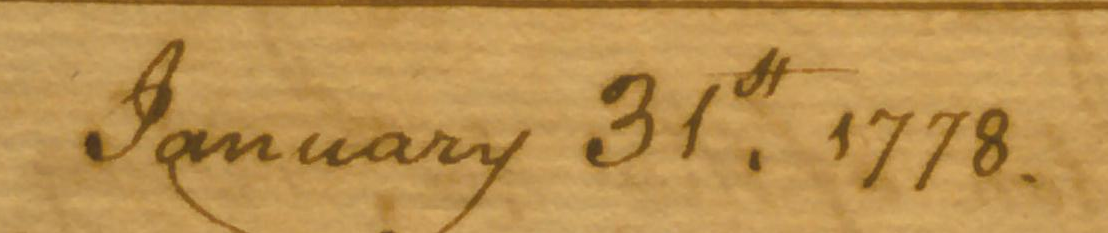January 31^st. 1778.
